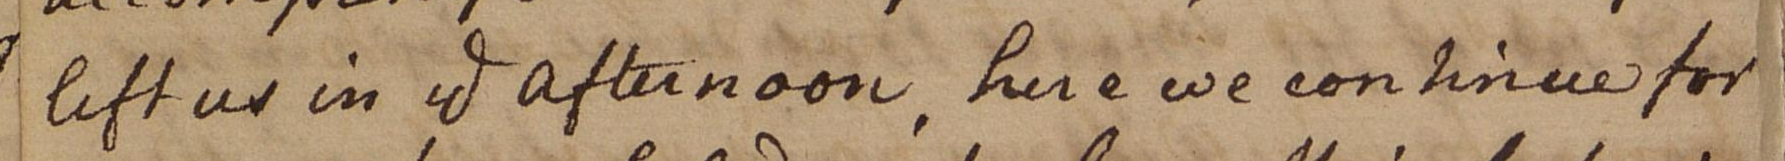left us in y^e afternoon, here we continue for
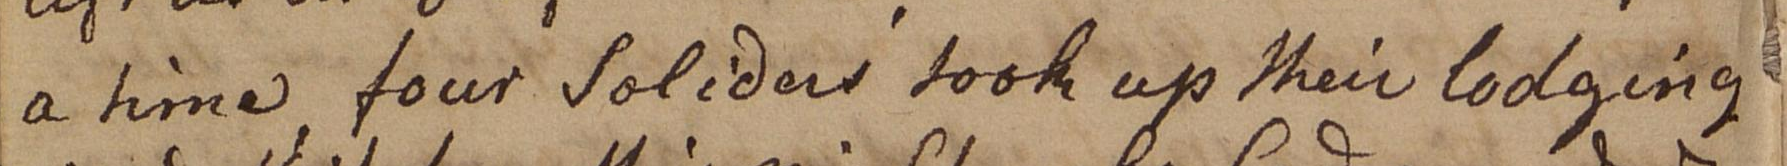a time, four Soliders took up their lodging
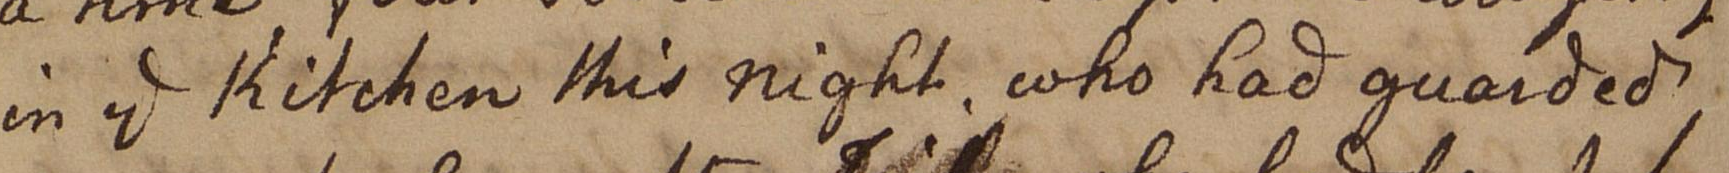in y^e Kitchen this night, who had guarded
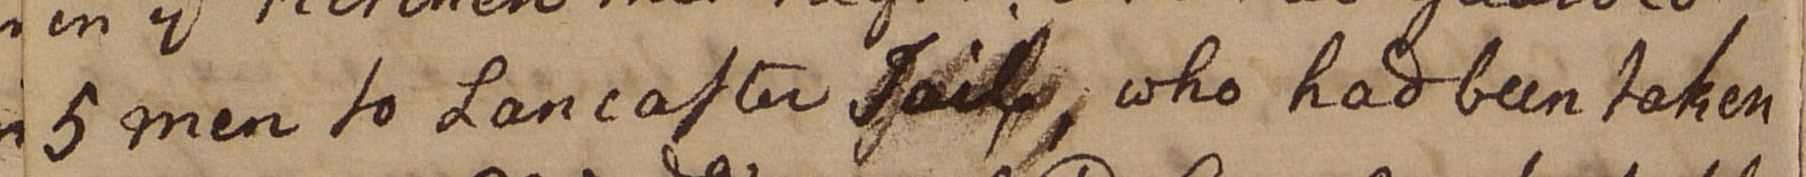5 men to Lancaster Jail. who had been taken
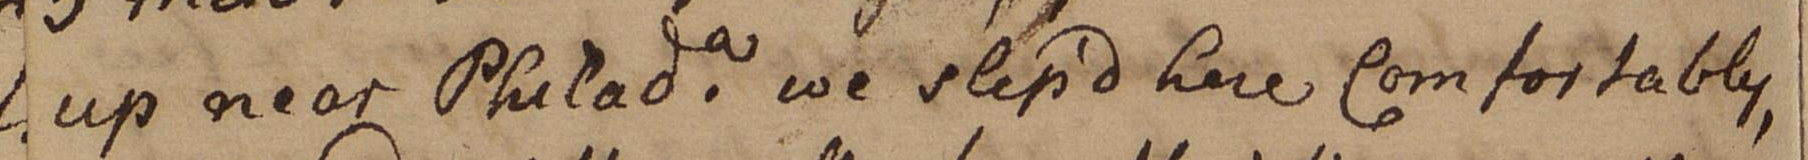up near Philad^a. we slep'd here comfortably,
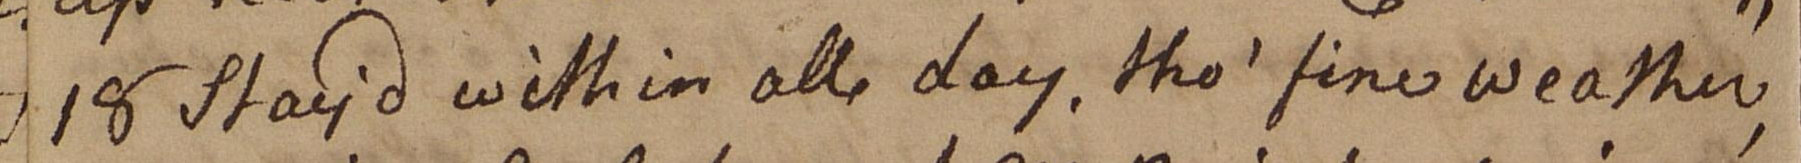18 Stay'd with in all day, tho' fine weather,
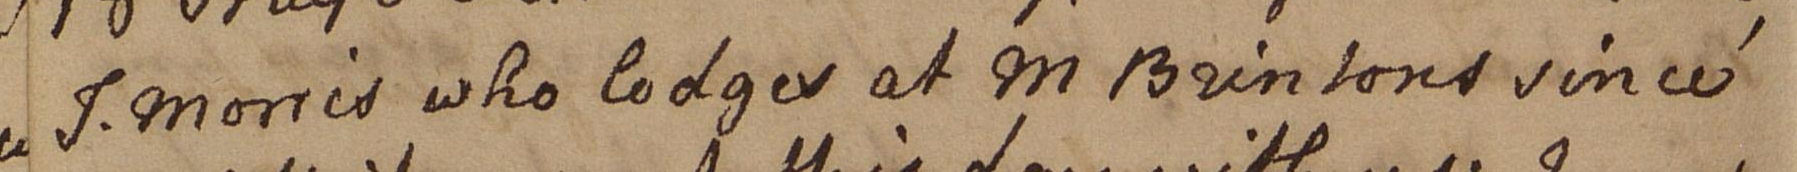T. Morris who lodges at M Brintons since
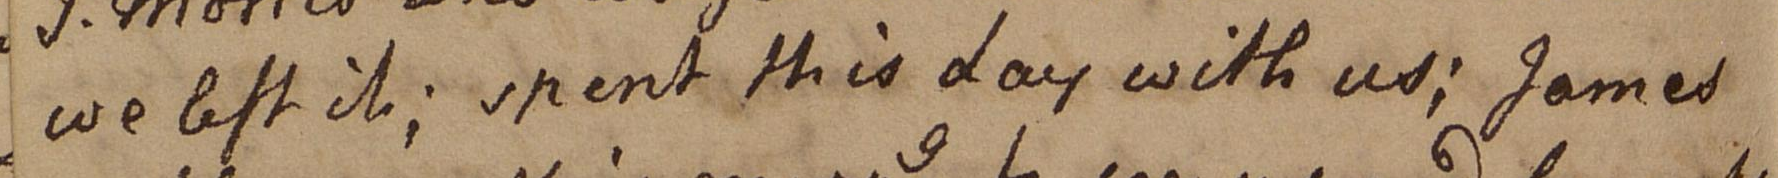we left it; spent this day with us; James
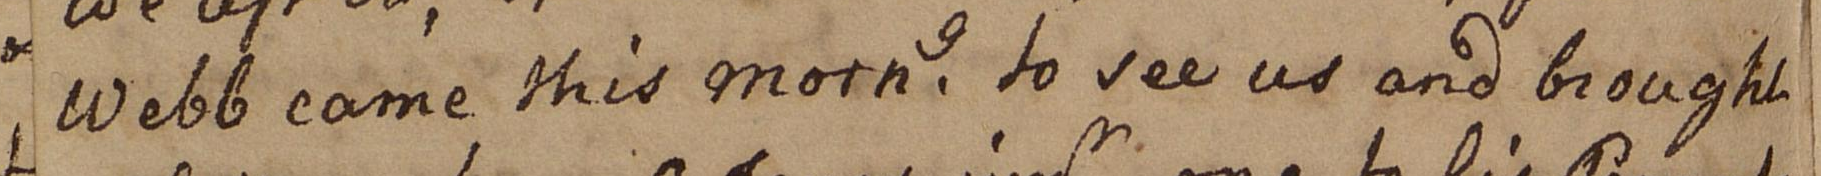Webb came this morn^g. to see us and brought
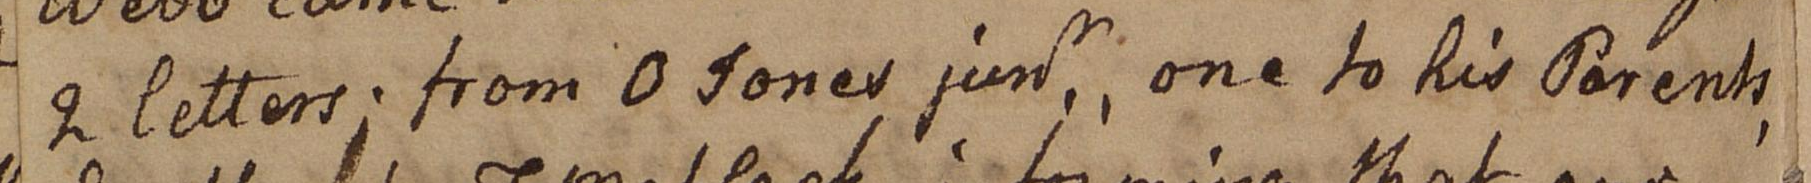2 letters; from O Jones jun^r., one to his Parents,
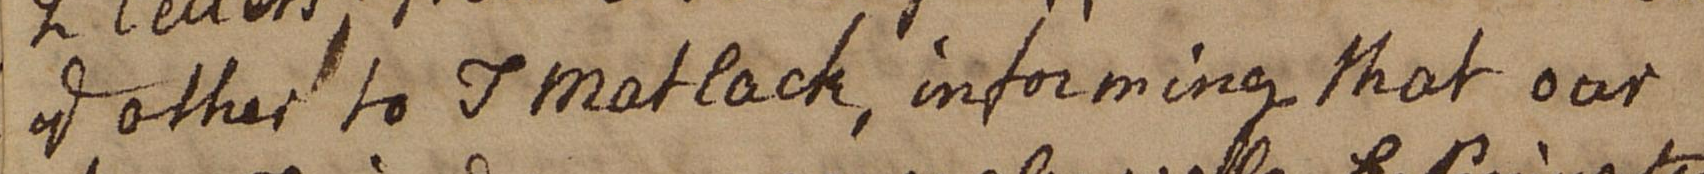y^e other to T Matlack, informing that our
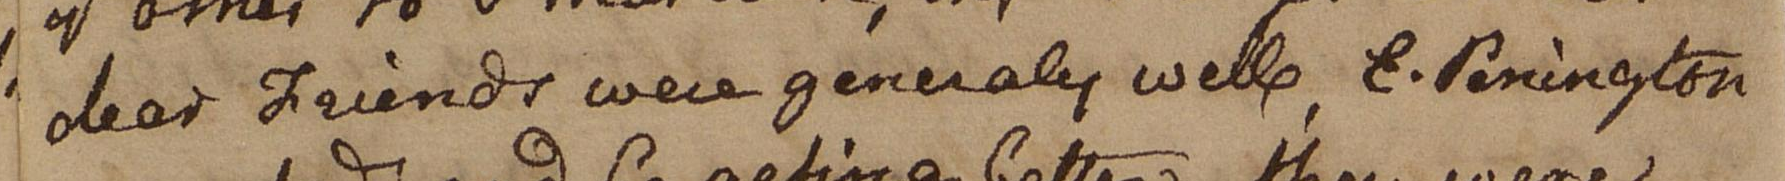dear Friends were generaly well, E. Penington
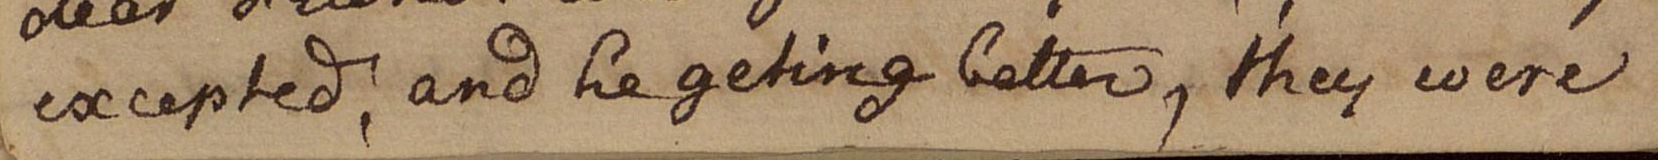excepted, and he geting better, they were
